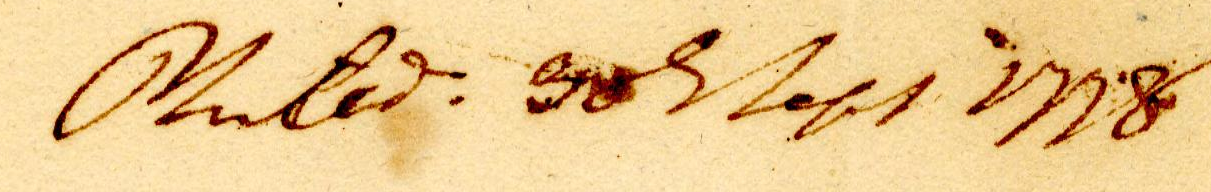Philad^a: 30 Sept 1778
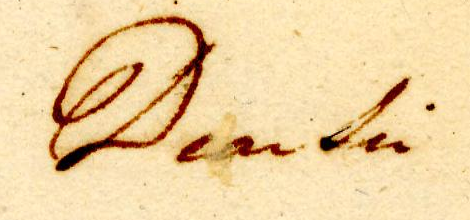Dear Sir
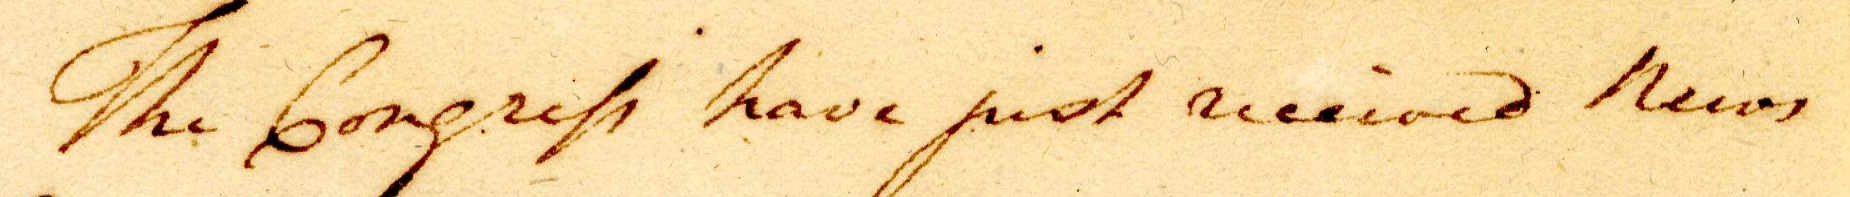The Congress have just received News
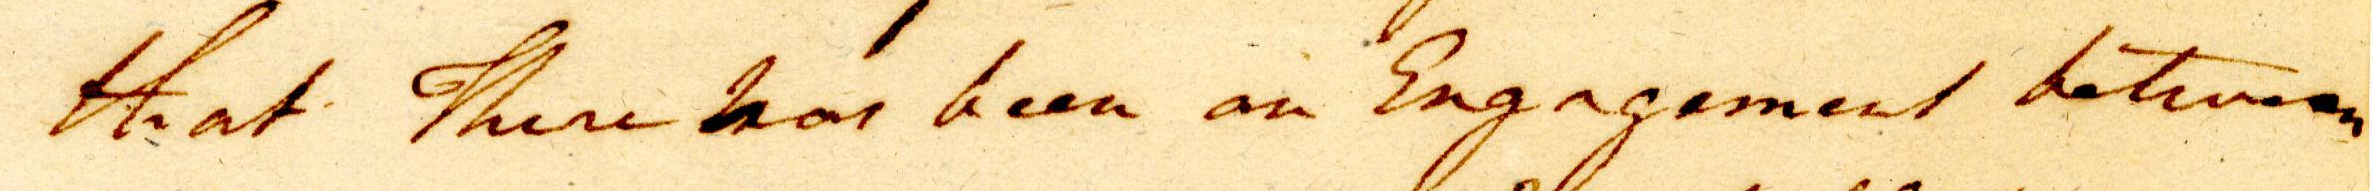that There has been an Engagement between
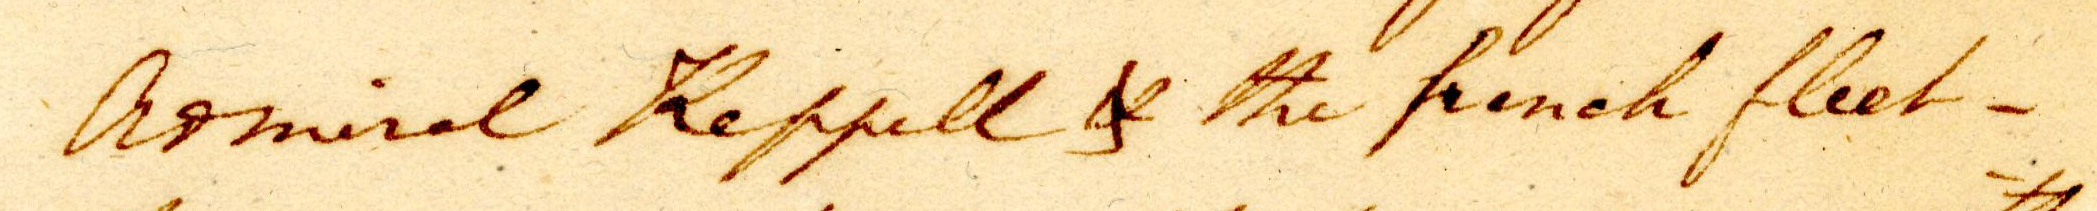Admiral Reppell & the French fleet.
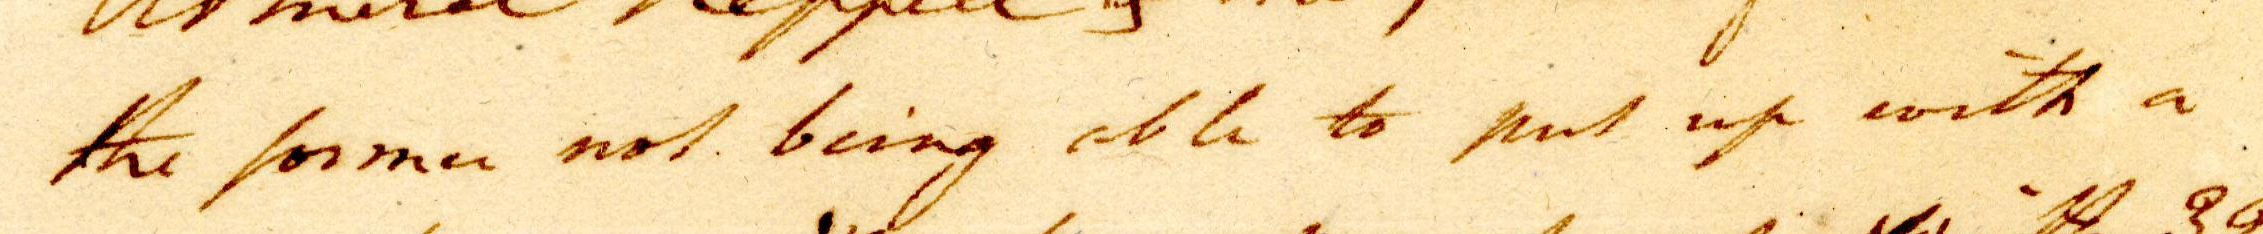the former not being able to put up with a
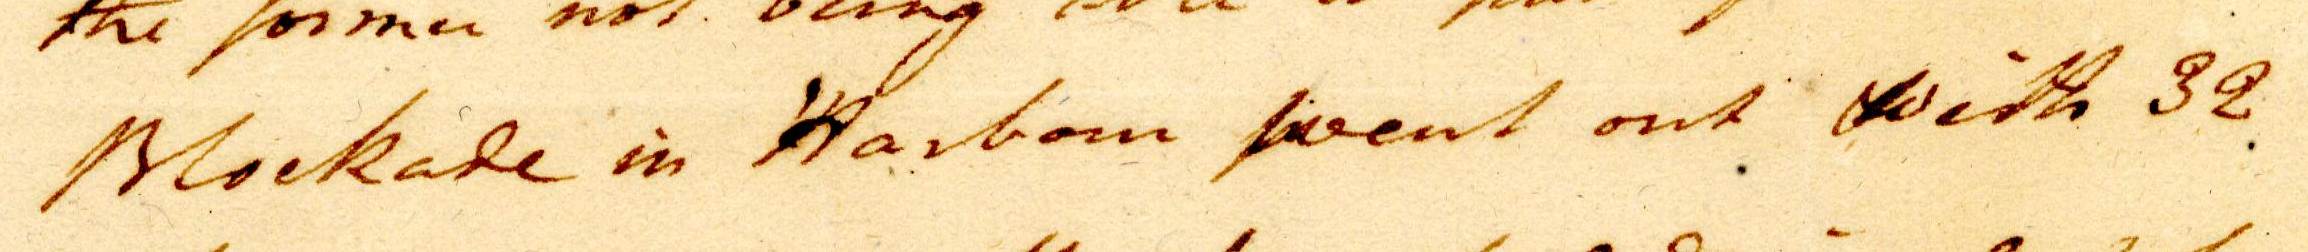Blockade in Harbour went out with 32
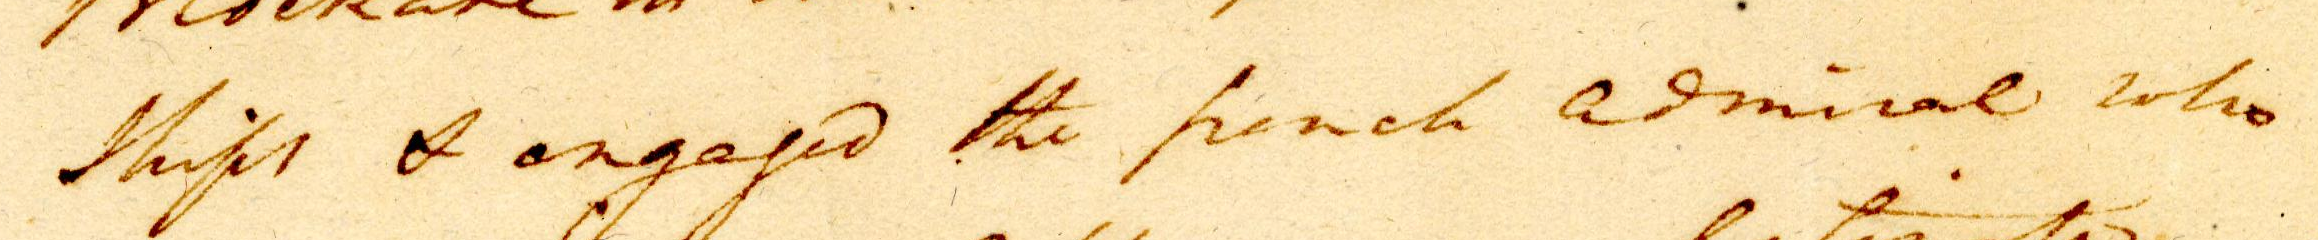Ships & engaged the French Admiral who
